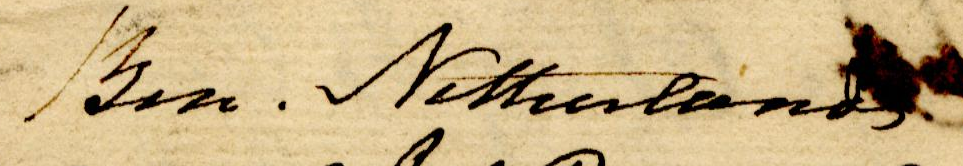Ben Netherlands
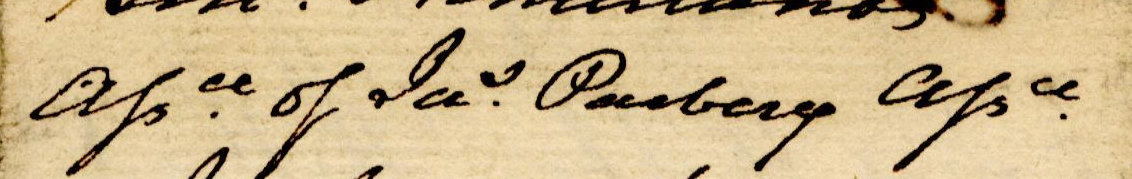Ass^ce. of Ja^s. Parberg Ass^ce.
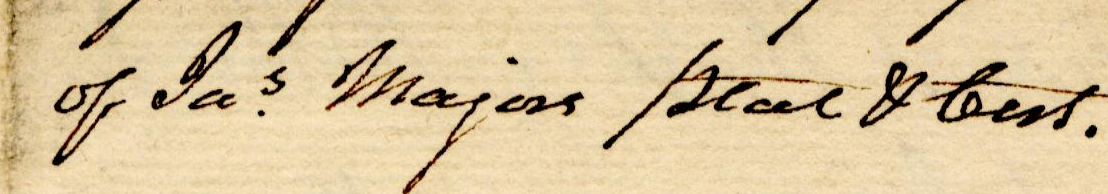of Ja^s. Majors plot & cost
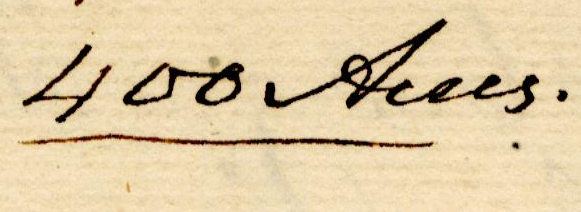400 Acres
